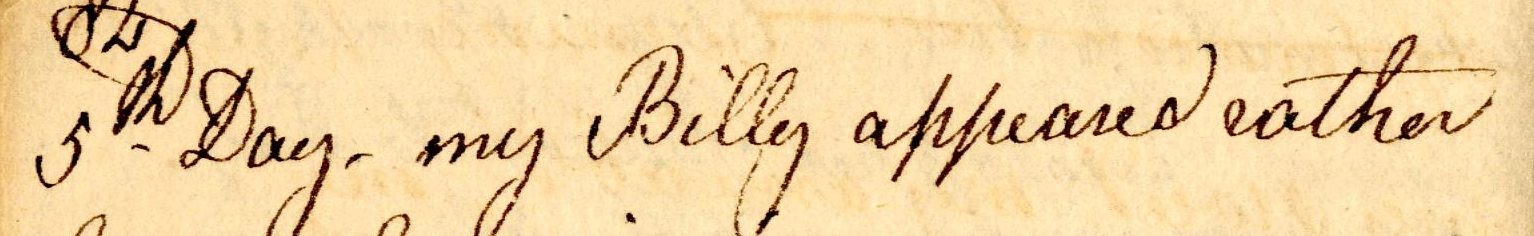5^th Day- my Billy appeared rather
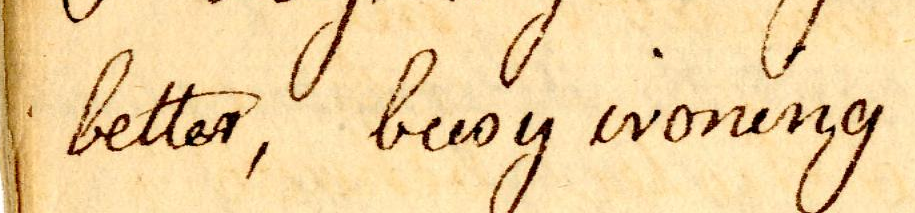better, busy ironing
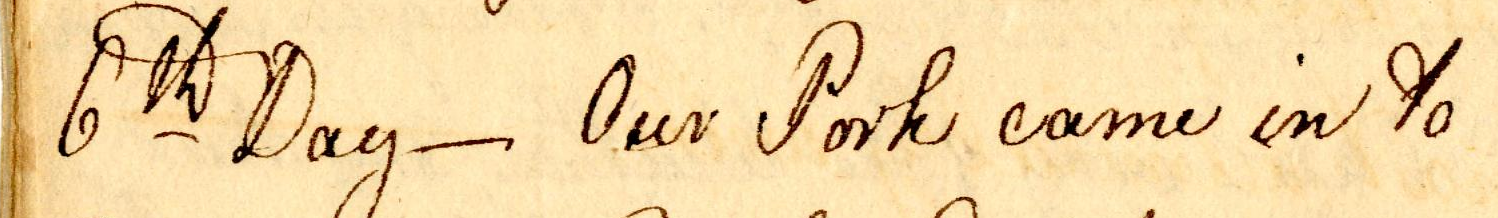6^th Day- Our Pork came in to
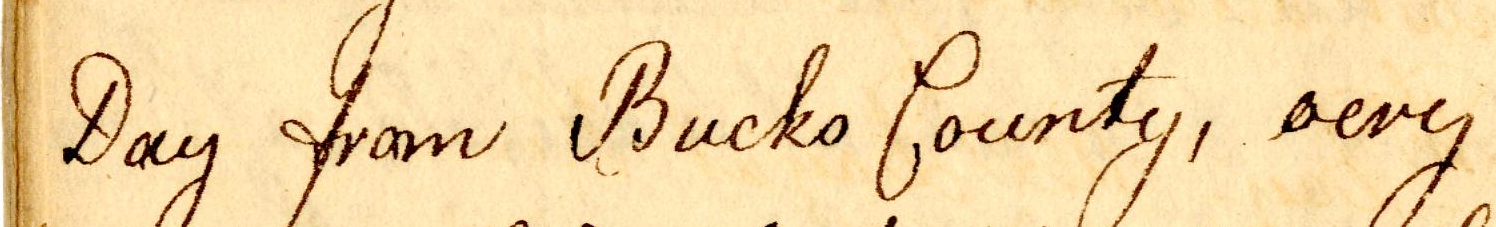Day from Bucks County, very
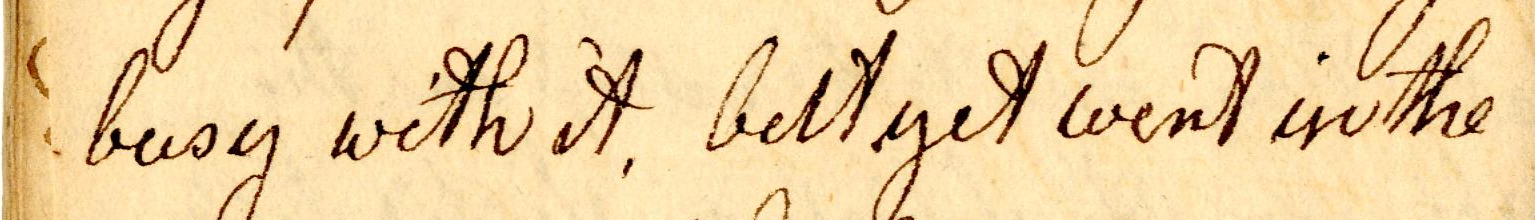busy with it, butt yet went in the
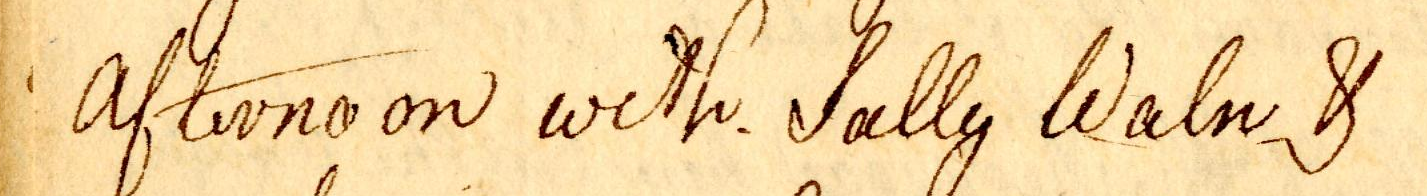Afternoon with Sally Waln &
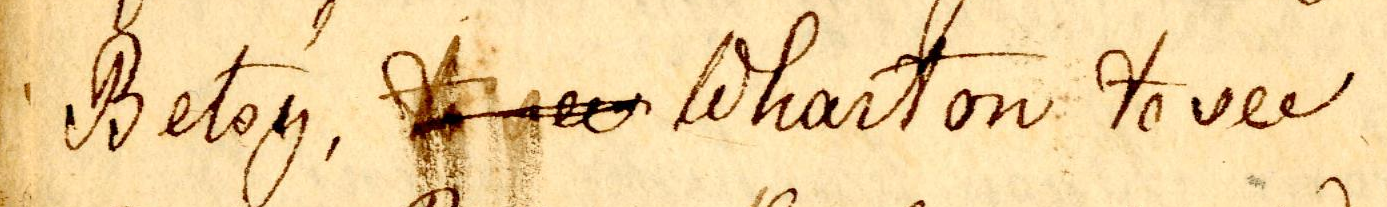Betsy, [to see] Wharton to see
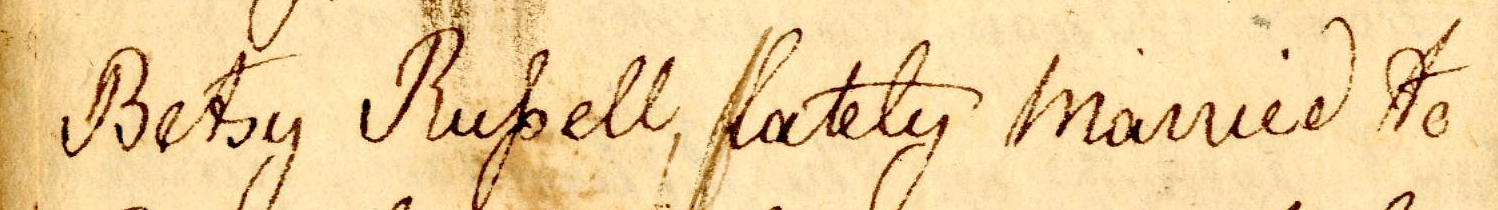Betsy Russell lately married to
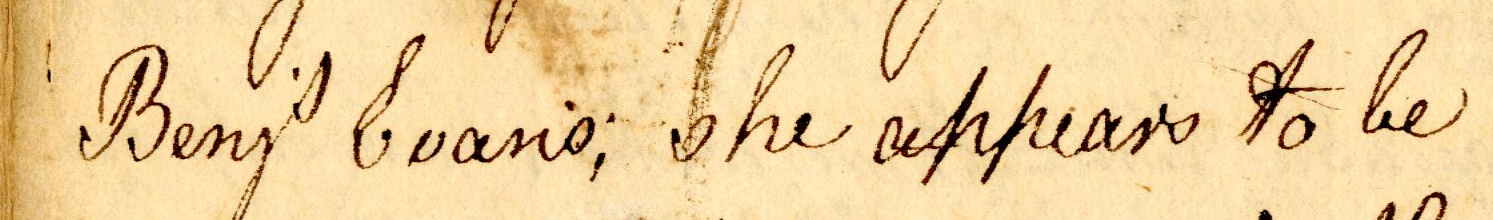Benj Evans, she appears to be
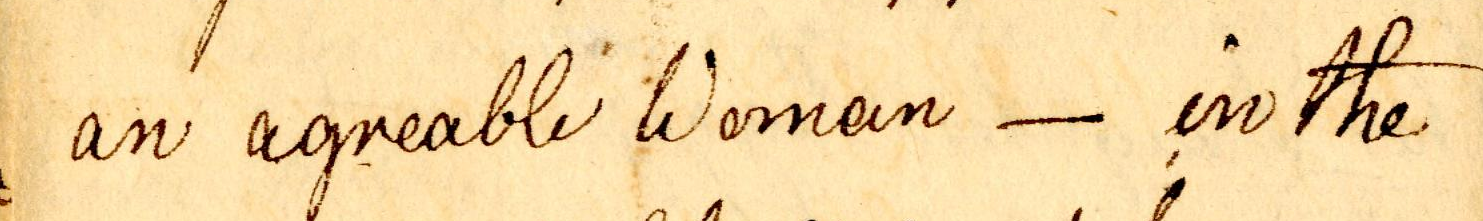an agreable Woman- in the
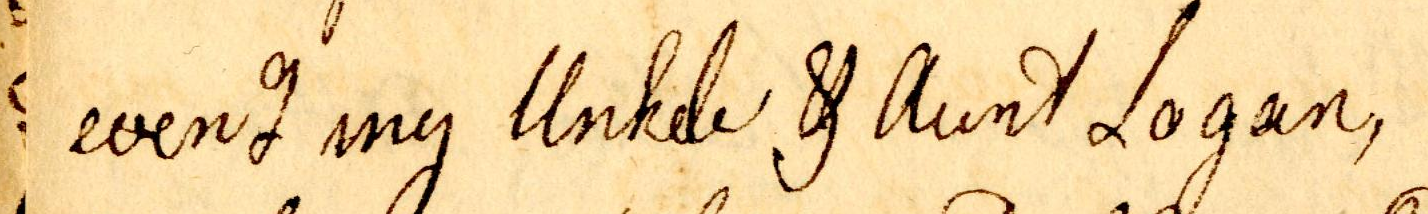even^g my Unkle & Aunt Logan,
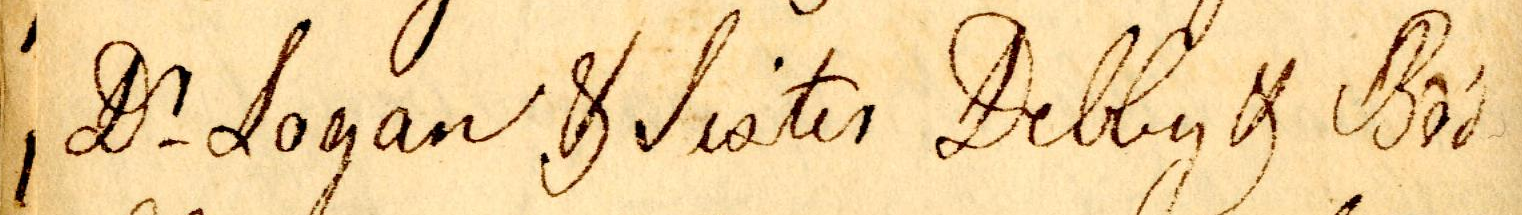D^r- Logan & Sister Debby & Bro'
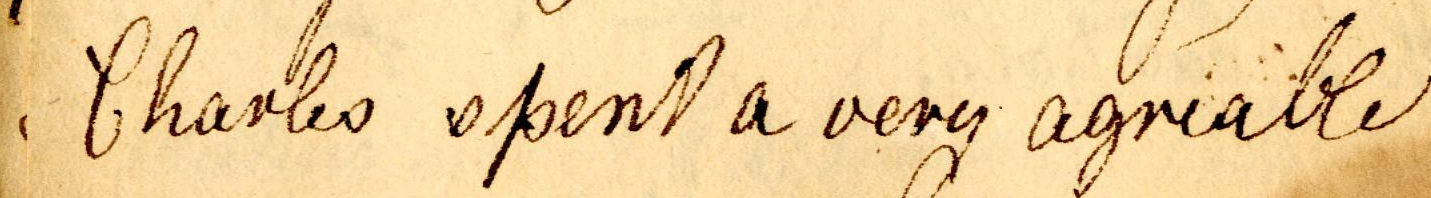Charles spent a very agreable
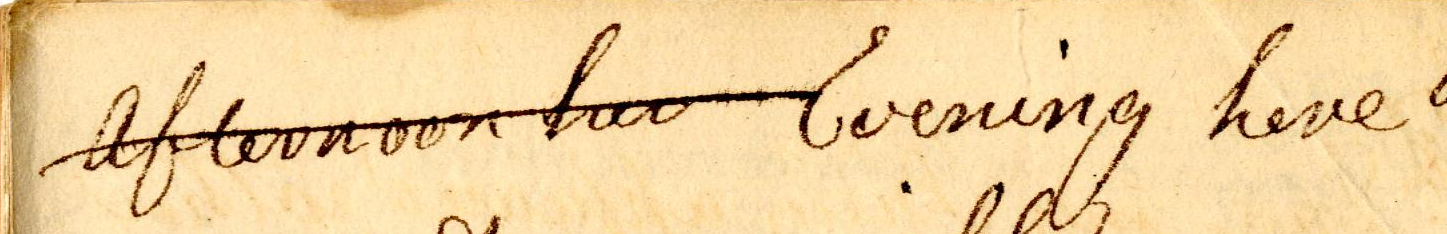[Afternoon her] Evening here
